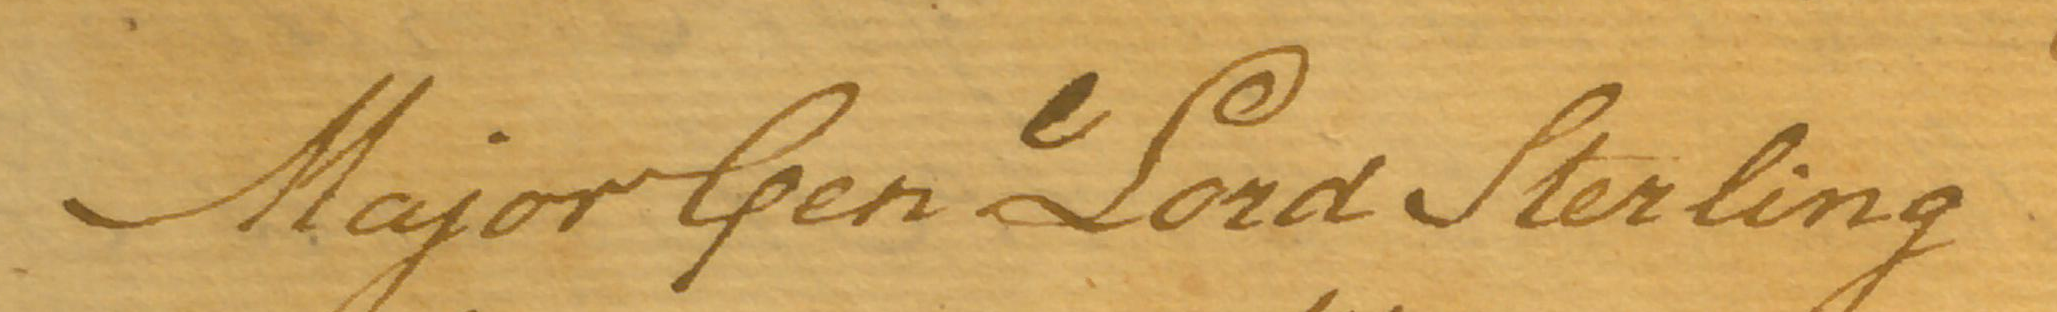Major Gen^l Lord Sterling
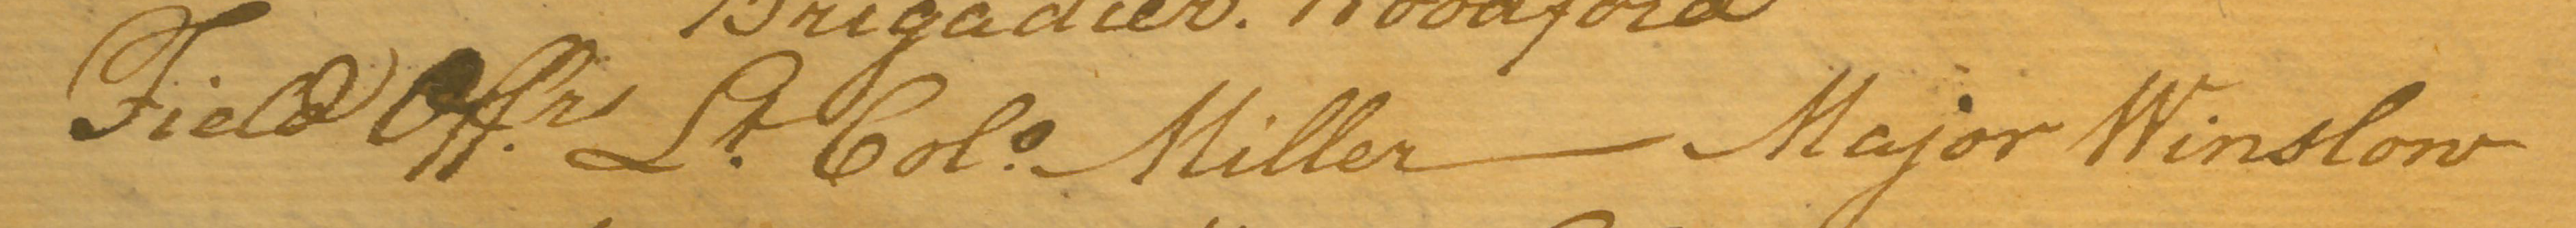Field Off^rs. L^t. Col^o. Miller Major Winslow
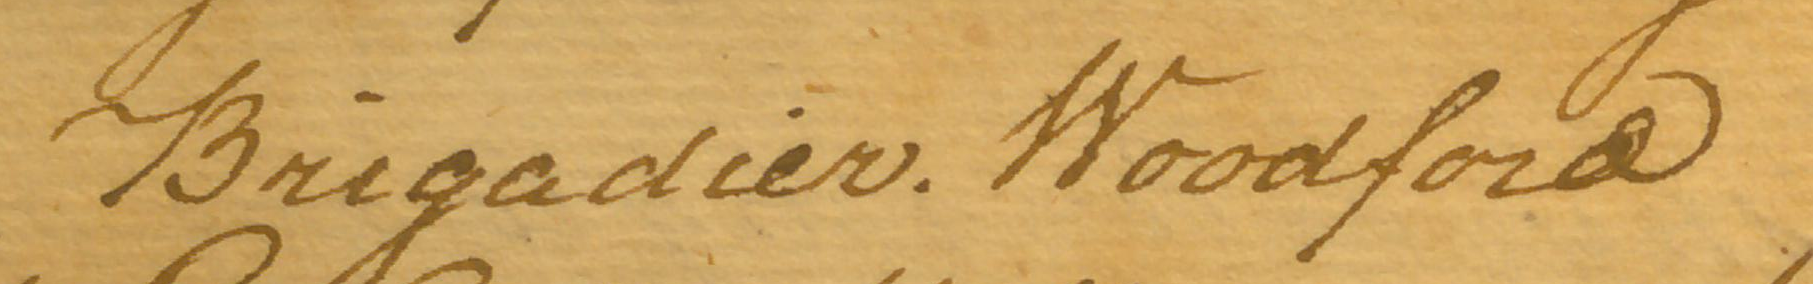Brigadier Woodford
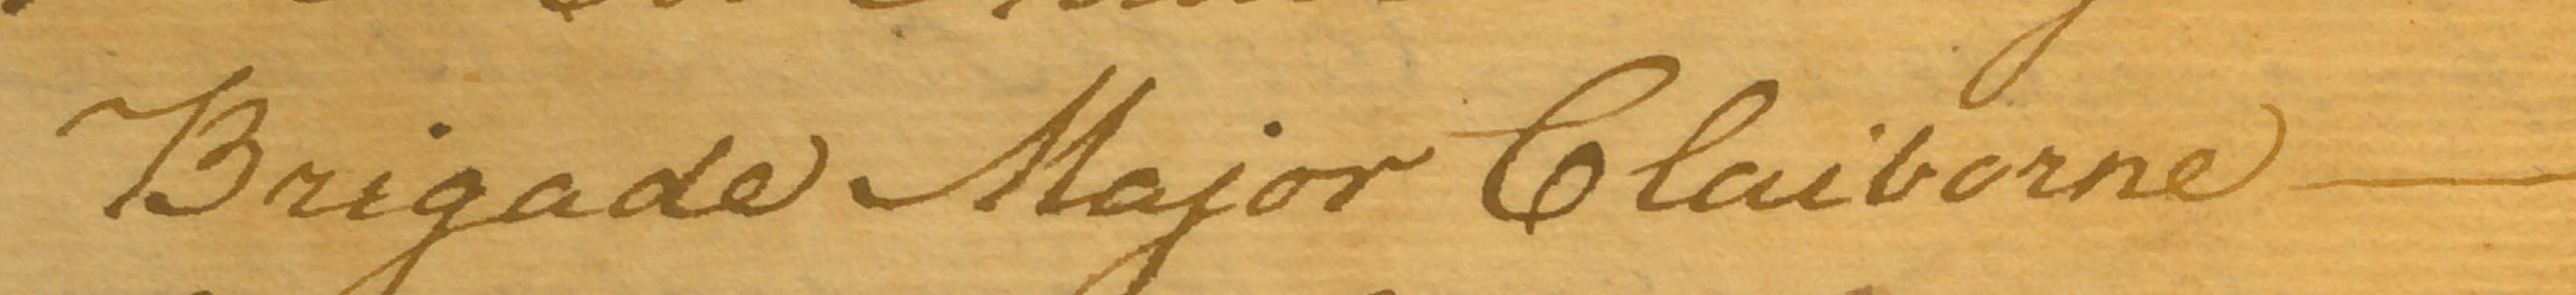Brigade Major Claiborne-
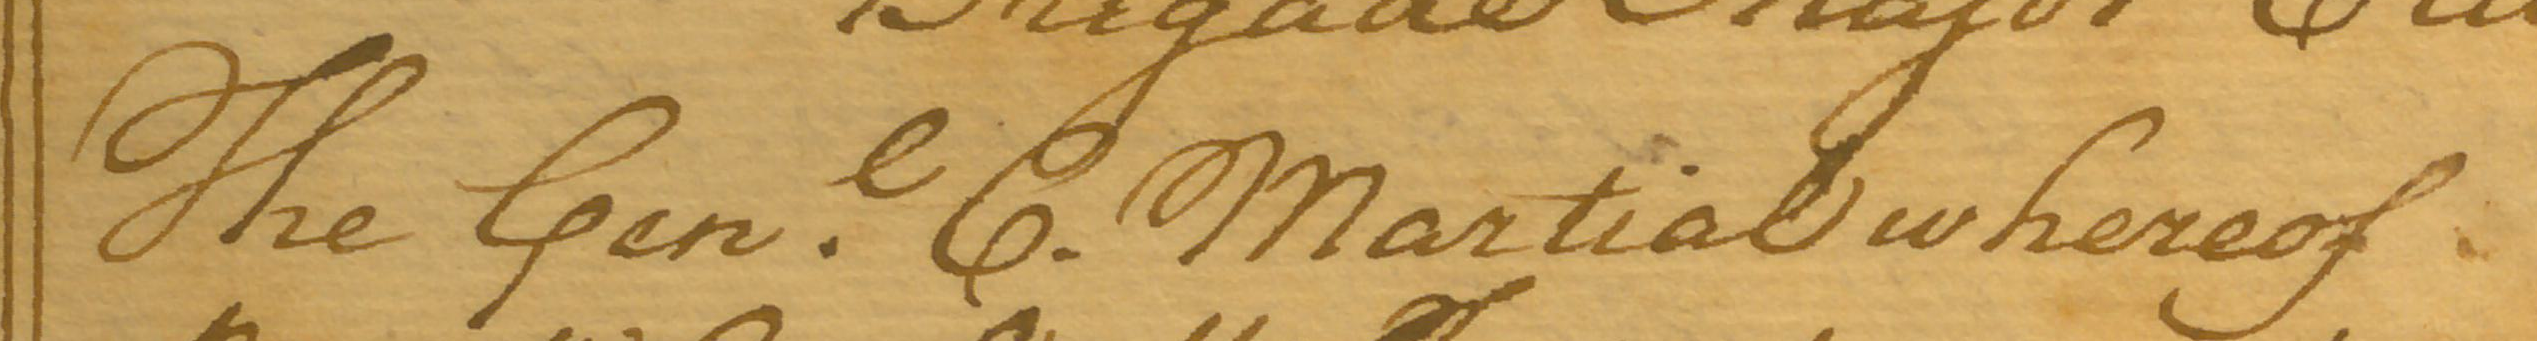The Gen^l. C. Martial whereof
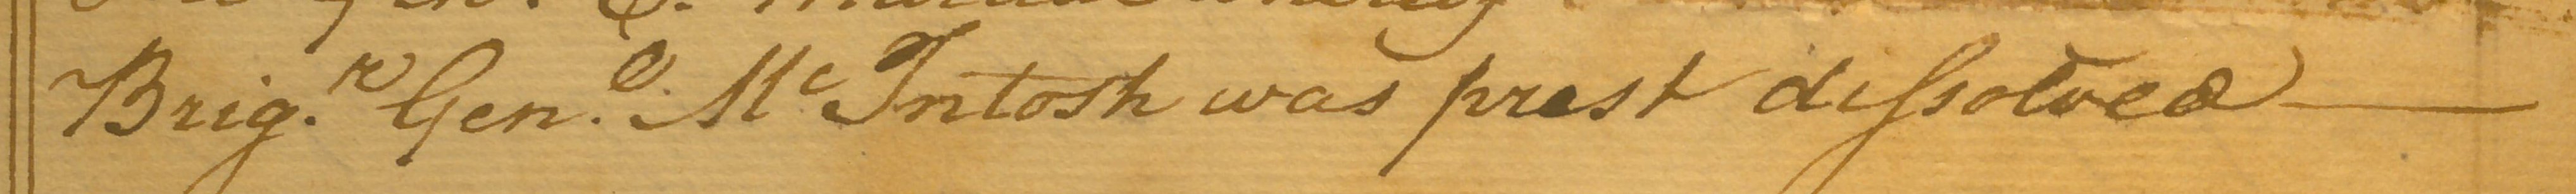Brig^r. Gen^l. M^cIntosh was prest dissolved-
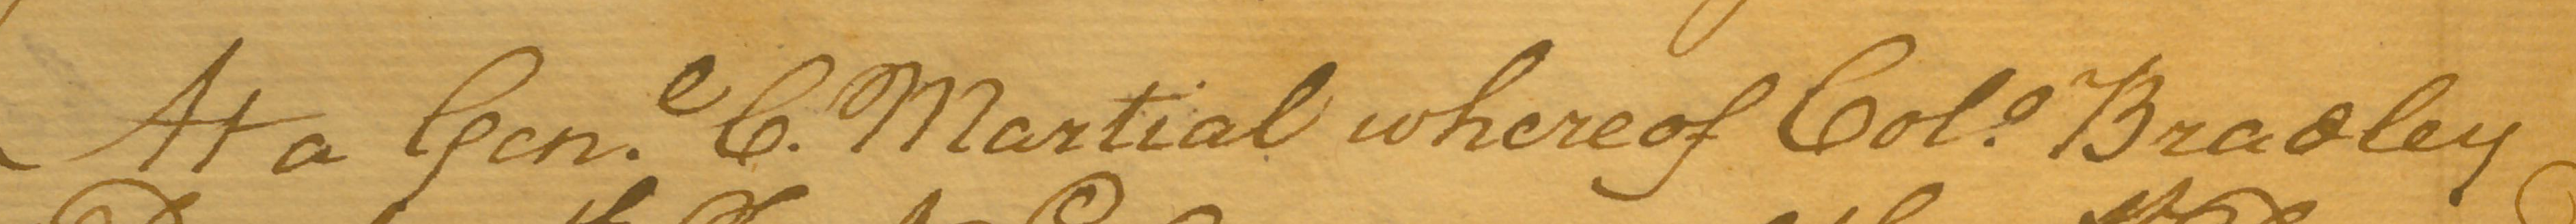At a Gen^l. C. Martial whereof Col^o. Bradley
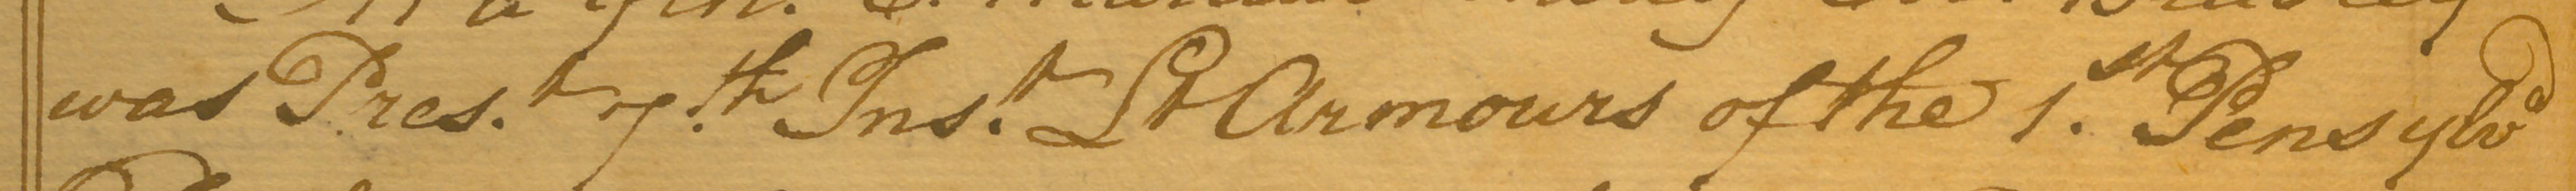was Pres^d. 7^th. Ins^t. Lt Armours of the 1^st. Pensylv^a.
